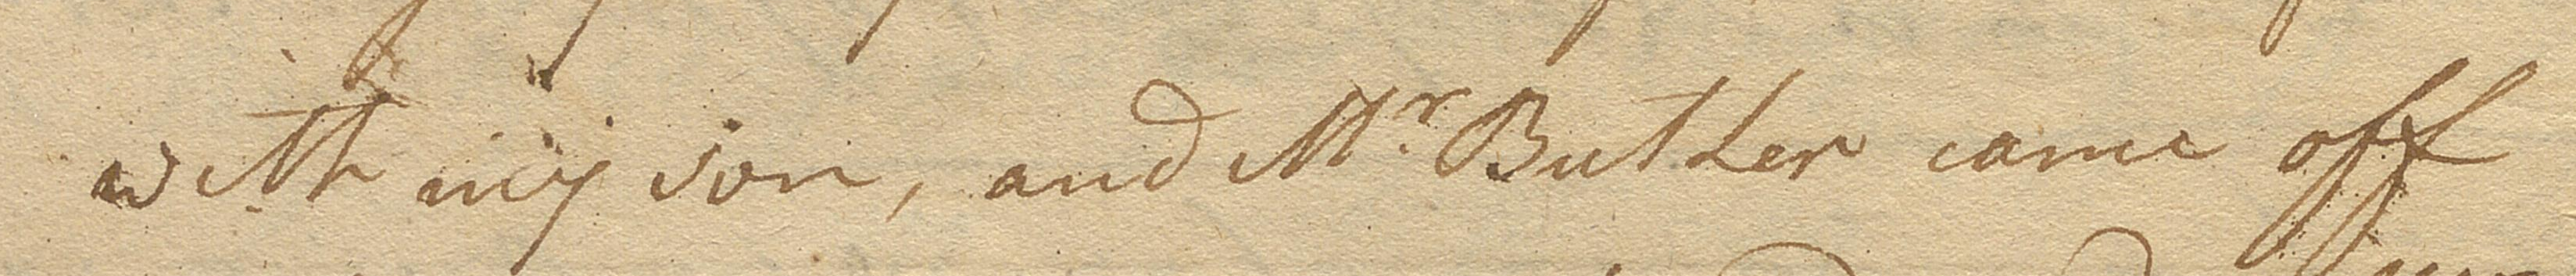with my son, and M^r. Butler came off
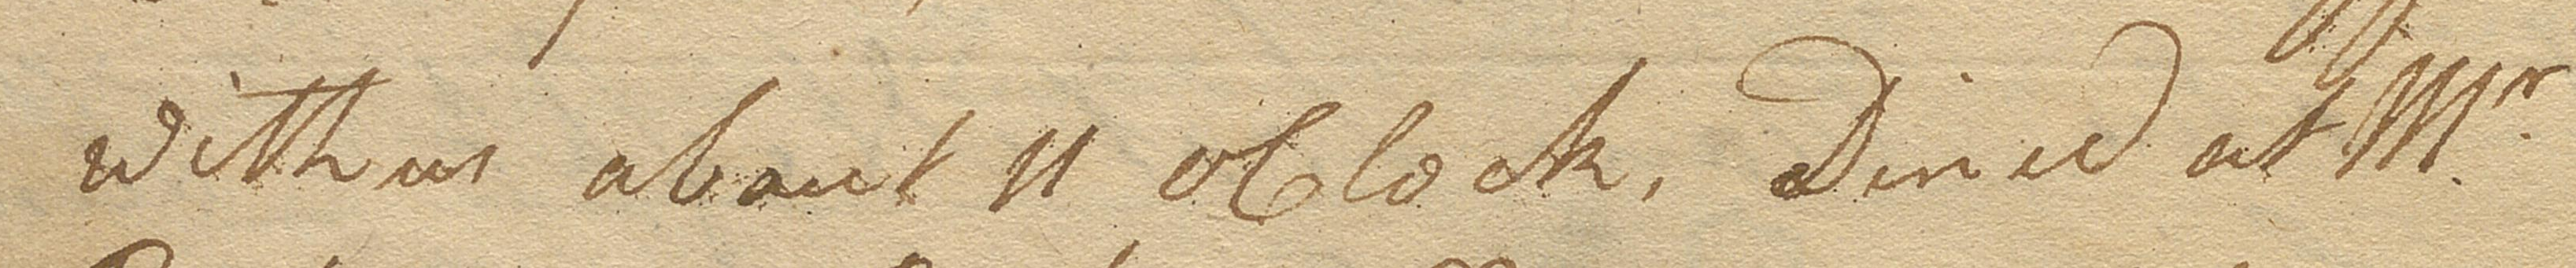with us about 11 oClock. Dined at M^r.
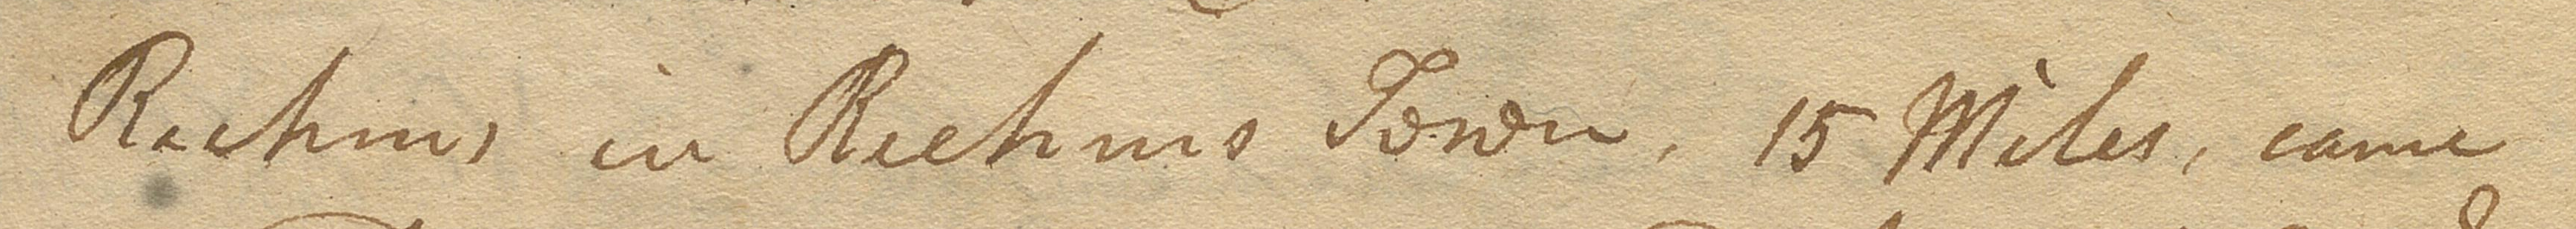Rechms in Rechms Town, 15 Miles, came
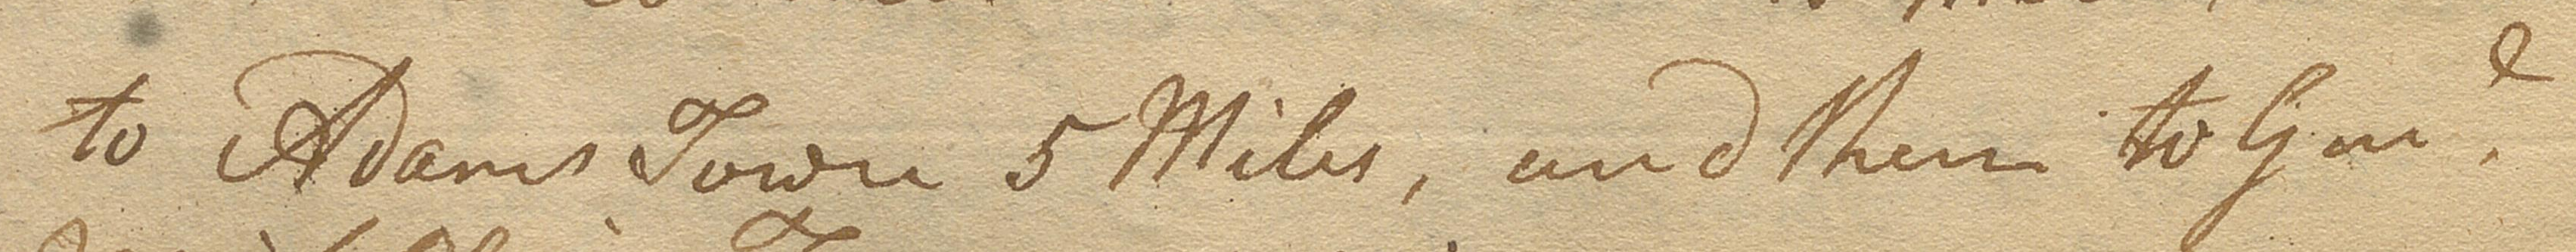to Adams Town 5 Miles, and then to Gen^l.
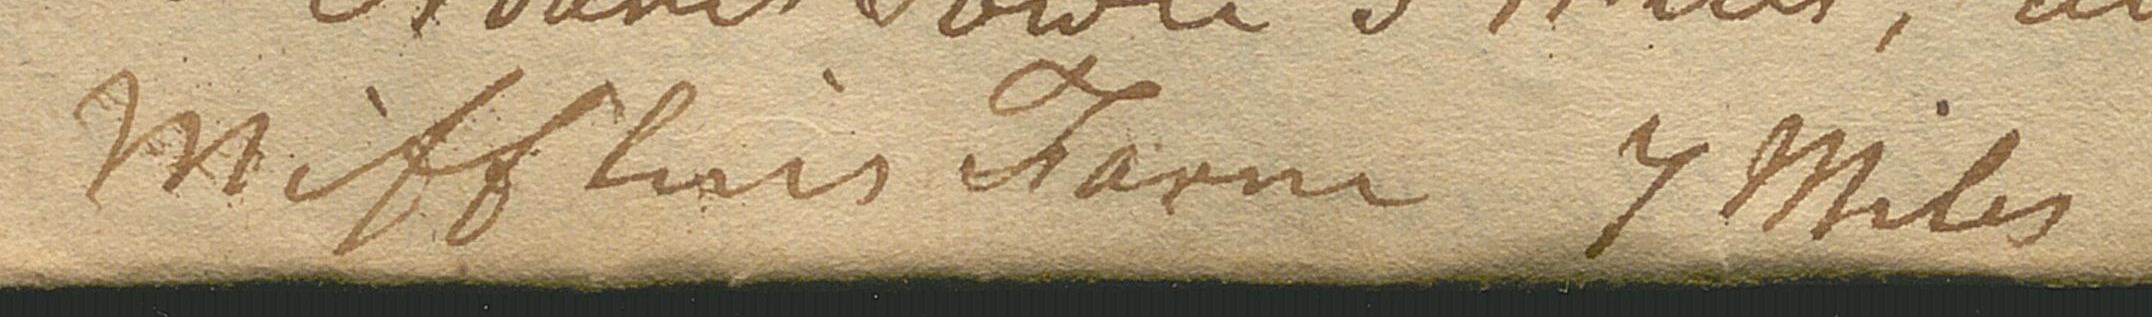Mifflins Farm 7 Miles
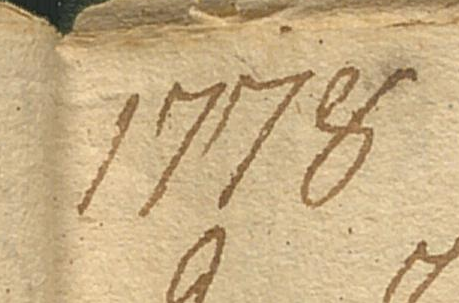1778
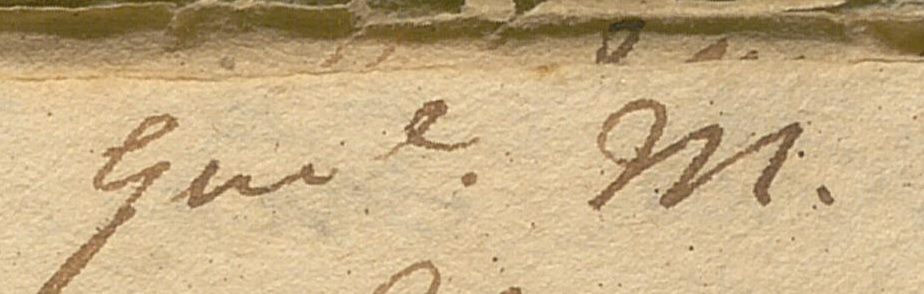Gen^l. M.
